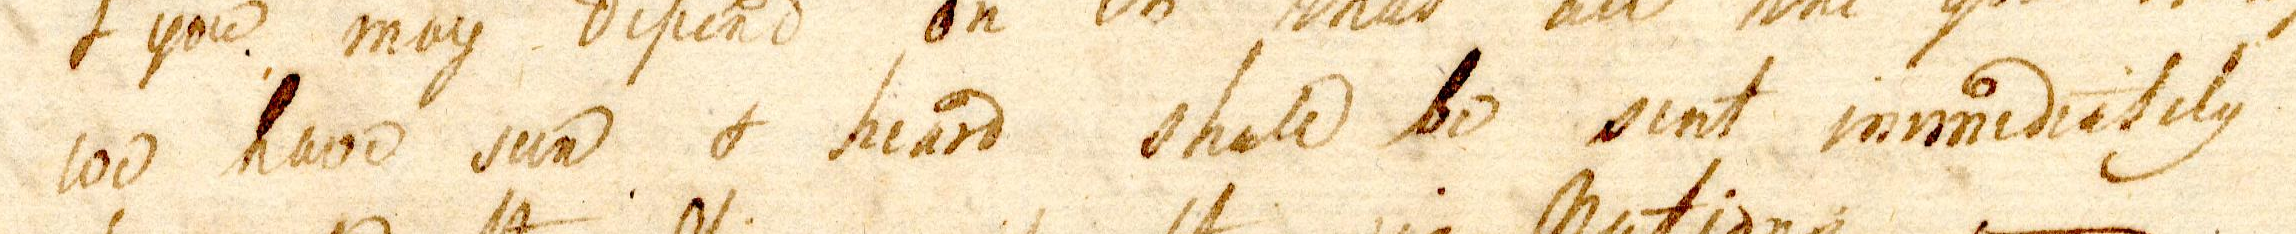we have seen & heard shall be sent immediately
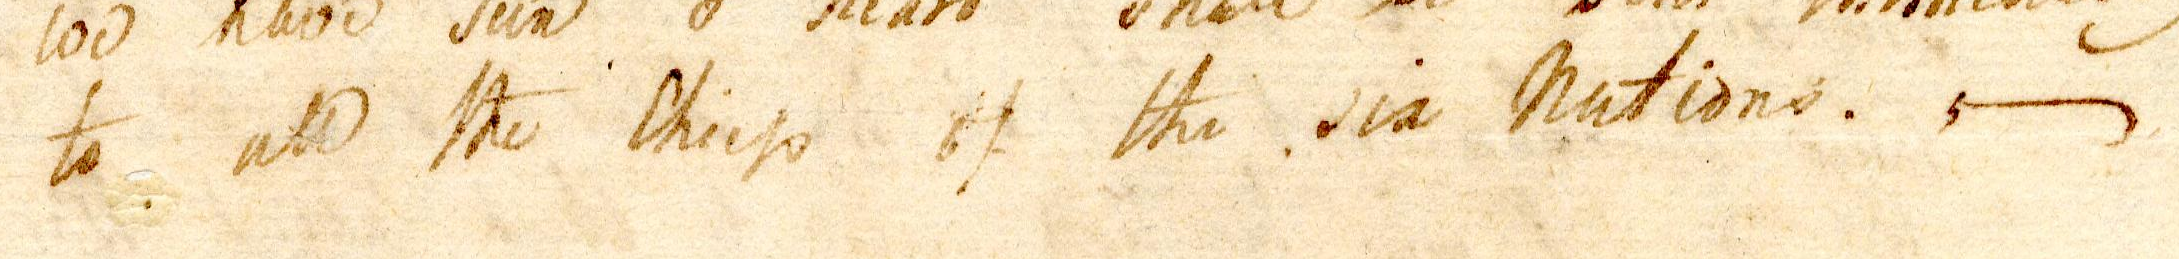to all the Chiefs of the six Nations.-
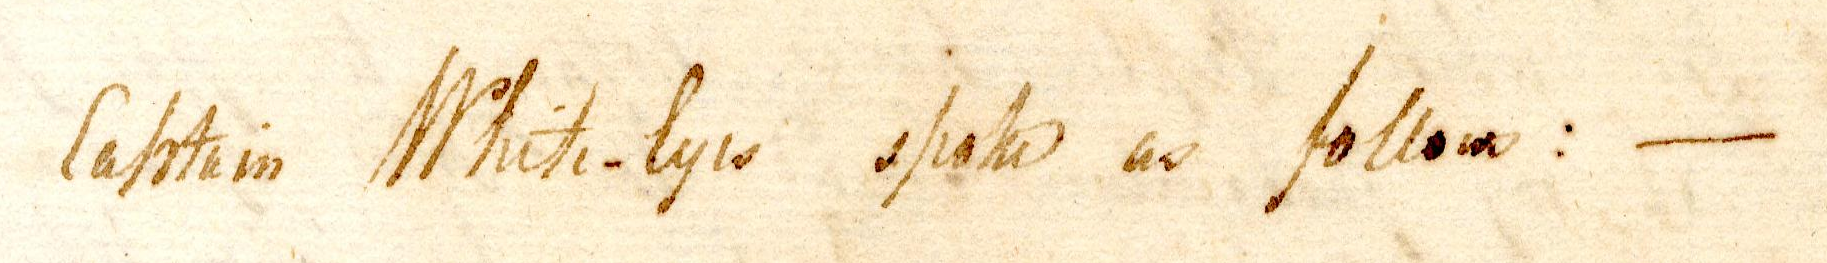Captain White-Eyes spoke as follows:-
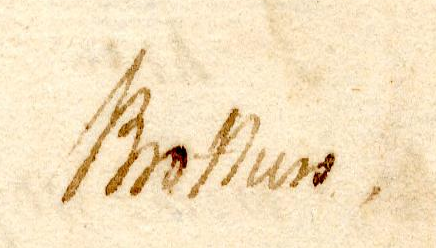Brothers,
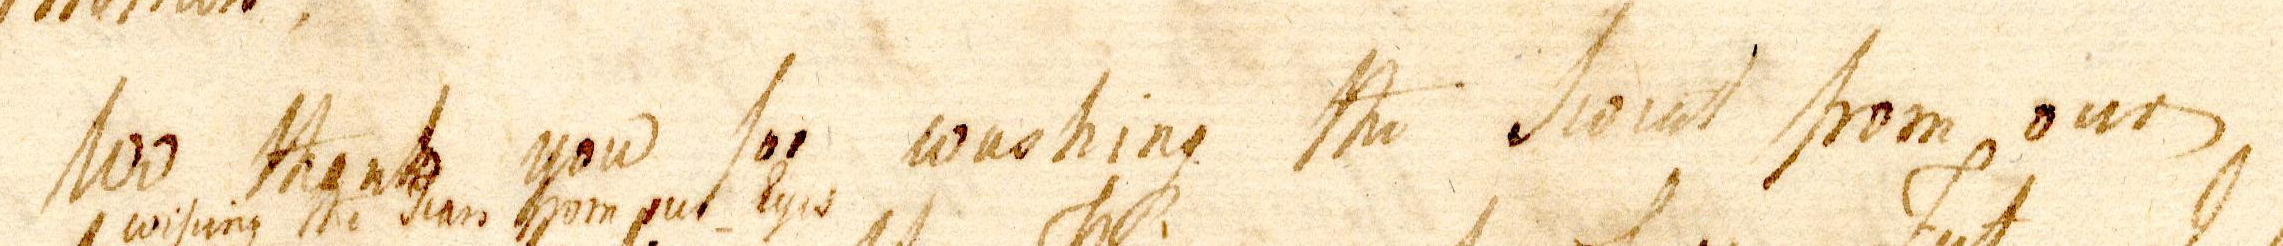We thank you for washing the Sweat from our
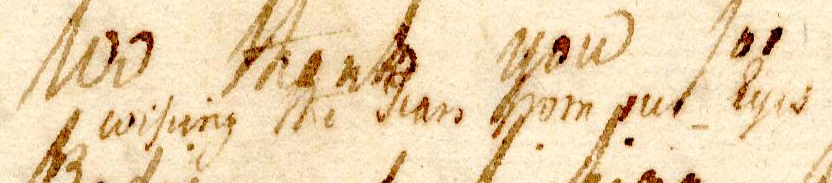wiping the Tears from our Eyes
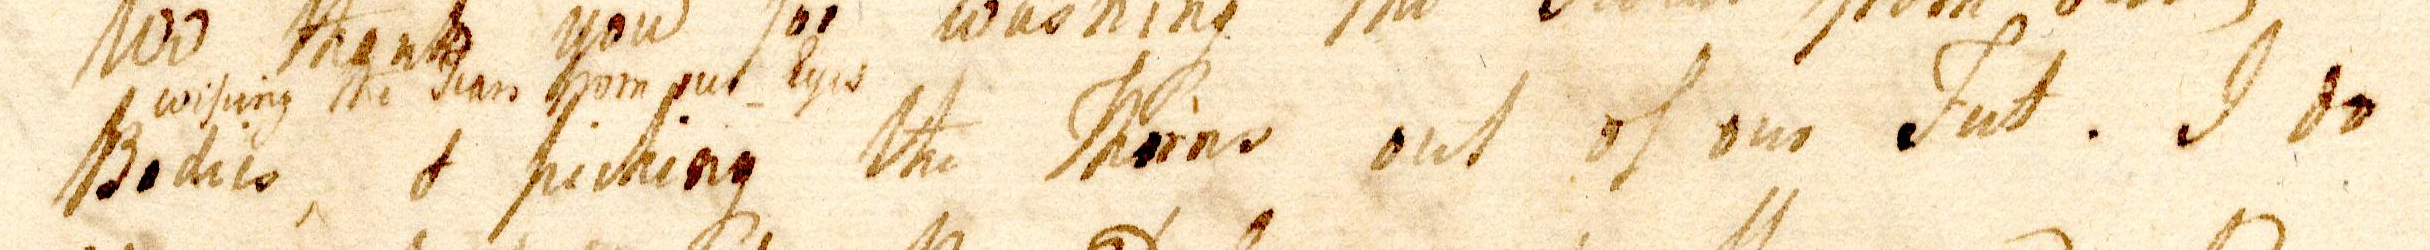Bodies, ^ & picking the Thorns out of our Feet. I do
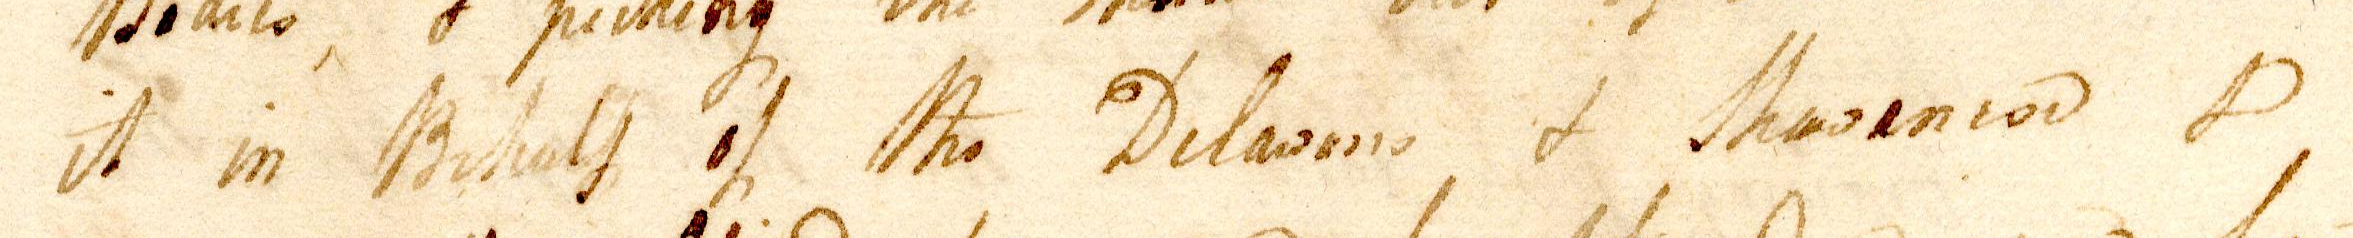it in Behalf of the Delawares & Shawanese &
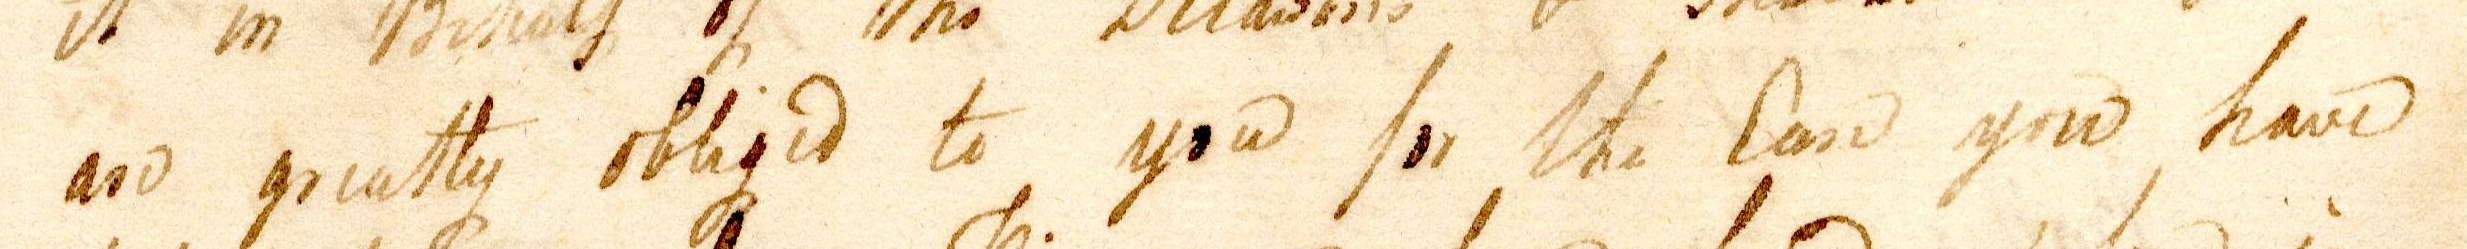are greatly obliged to you for the Care you have
